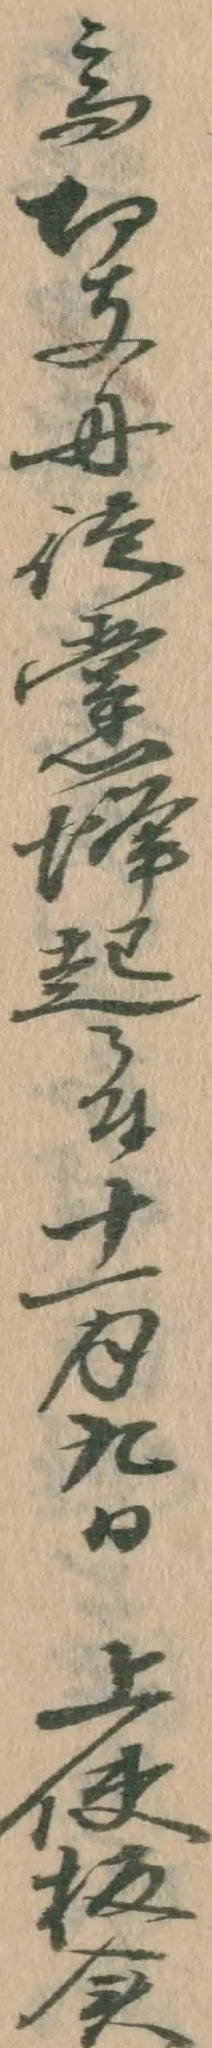に而切支丹徒党蜂起に付十一月九日上使板倉
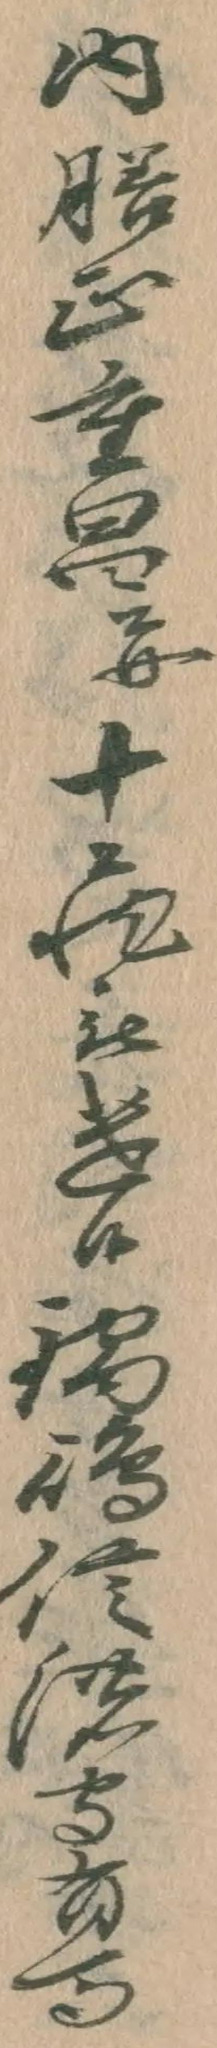内膳正重昌幷十蔵被遣候鍋島信濃守有馬
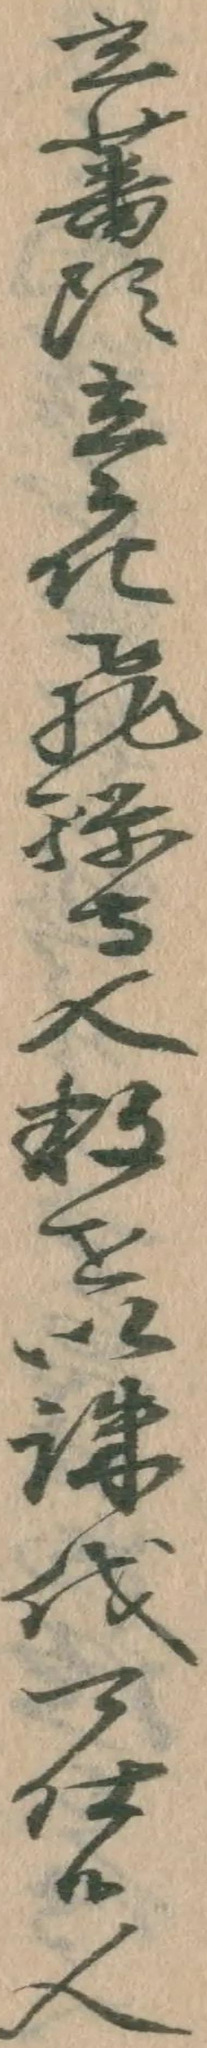玄蕃頭立花飛騨守人数を以誅伐可仕候人
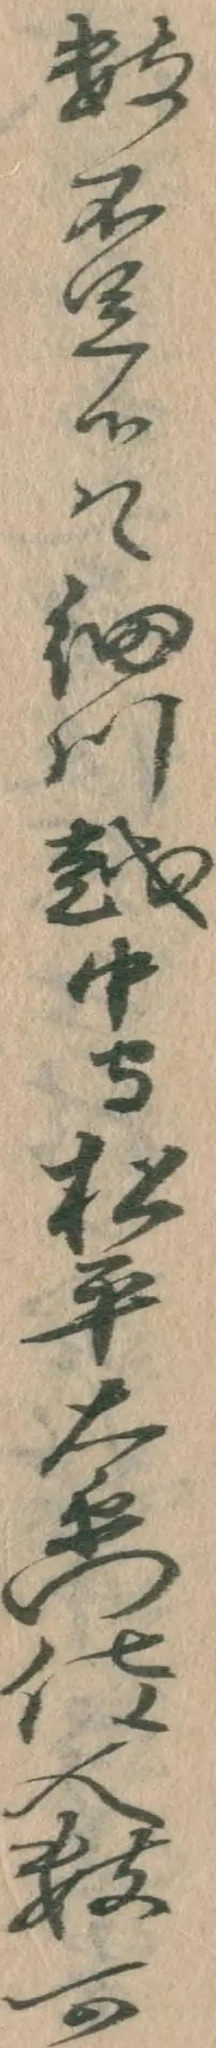数不足候はゝ細川越中守松平右衛門佐人数可
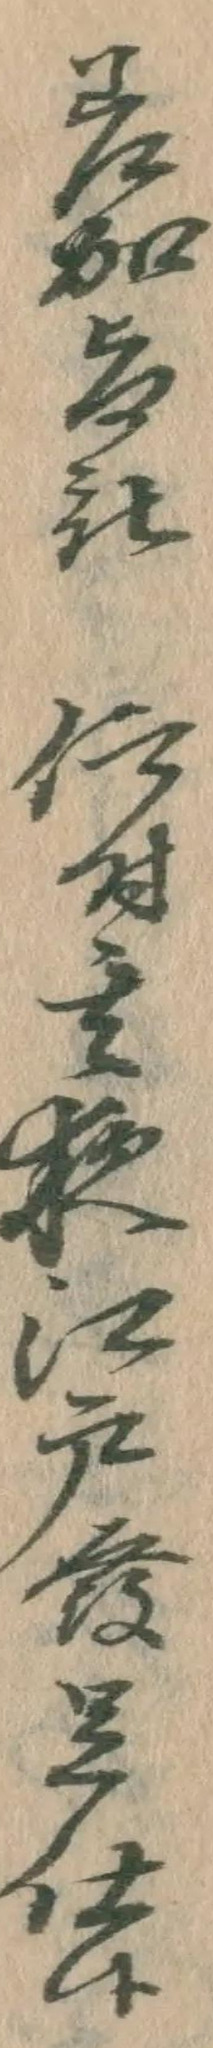差加旨被仰付其夜江戸発足仕候
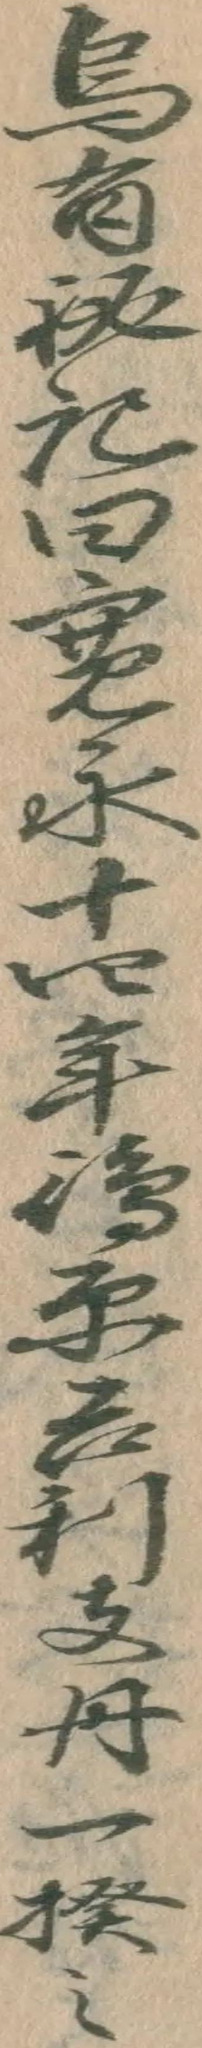烏有秘記曰寛永十四年島原吉利支丹一揆之
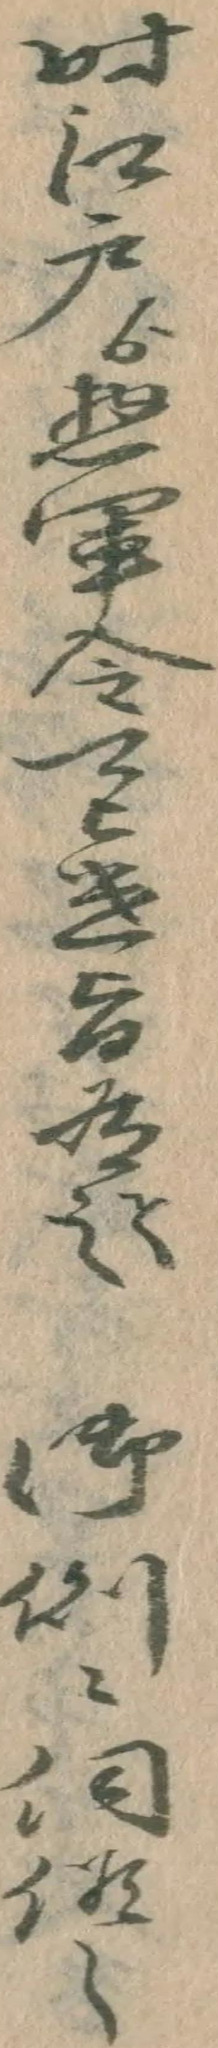時江戸ゟ惣軍令可被遣旨為哉御例に伺候し
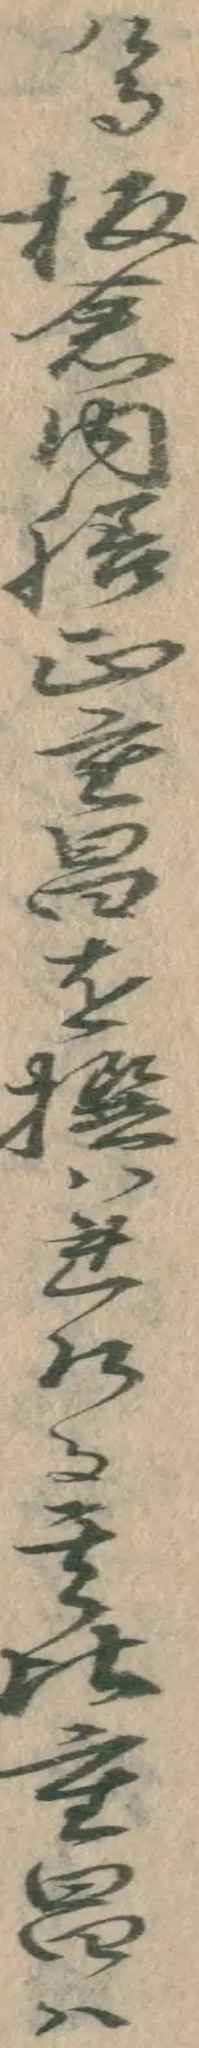ける板倉内膳正重昌を撰は連ける其比重昌は
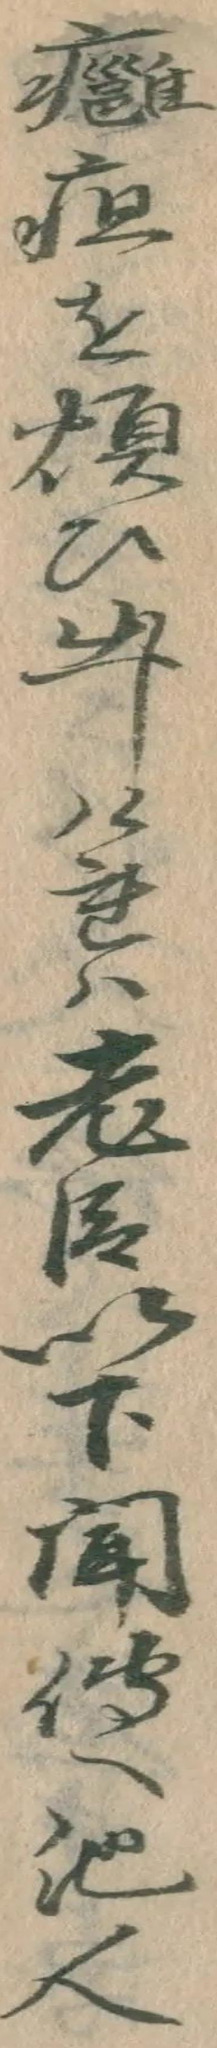癰疽を煩ひ出しけ連は老臣以下聞伝へ他人
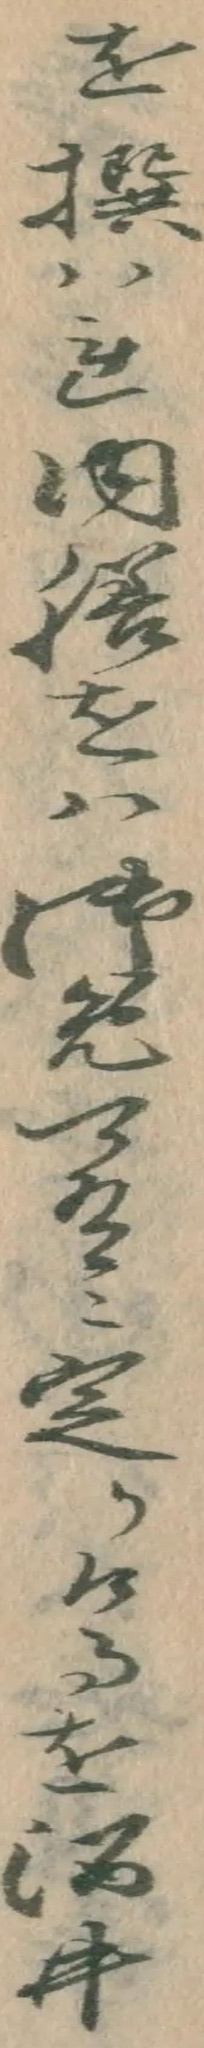を撰は連内膳をは御免可有に定りけるを酒井
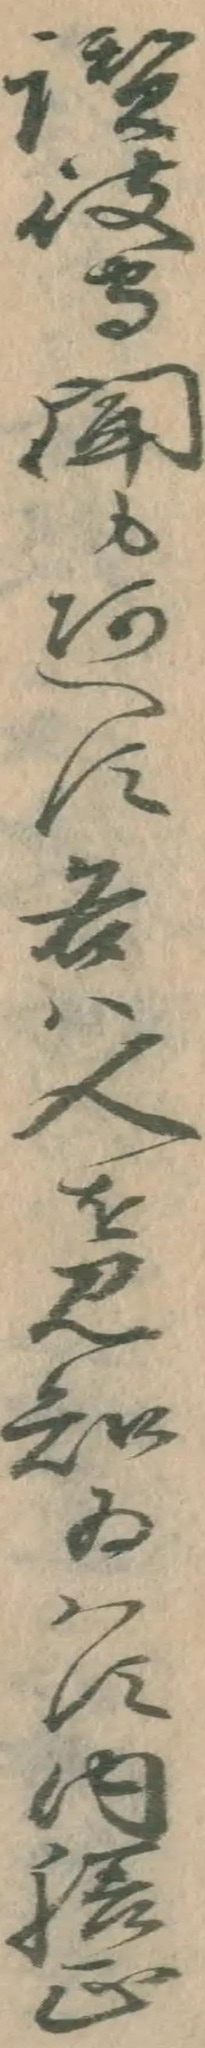讃岐守聞も阿へ須各は人を見知ゐは須内膳正

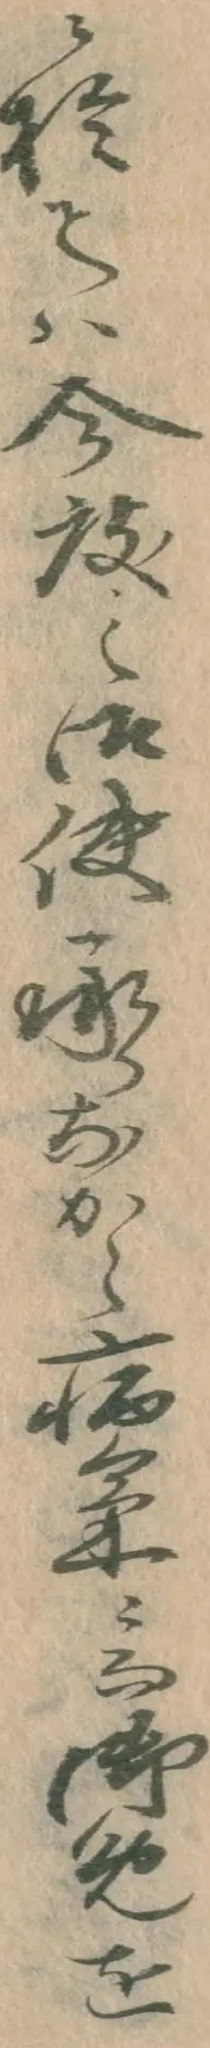に於ては今度之御し使承りながら病気に而御免を
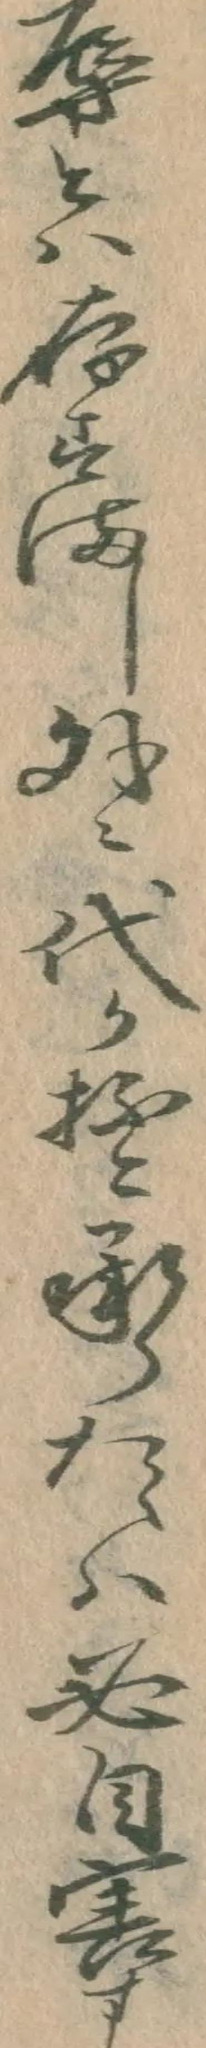辱とは存春満し外に代り抔と承りたらは必自害す
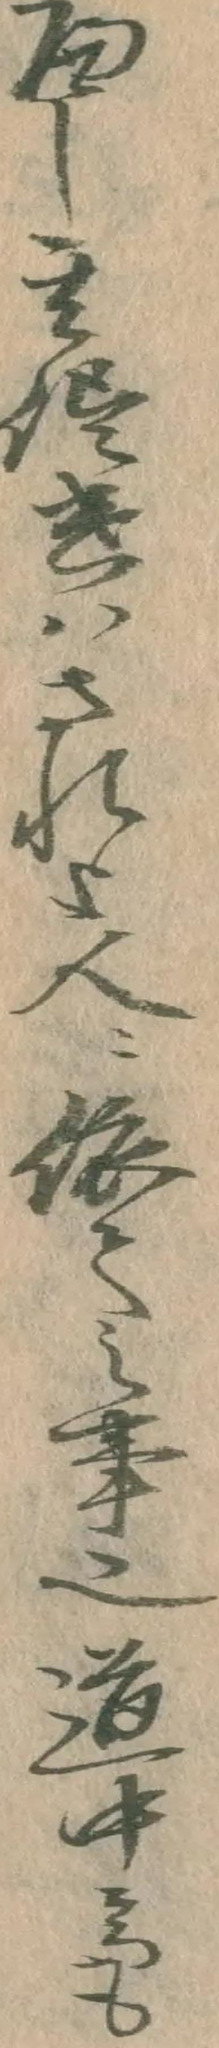遍し其侭遣はされよ人に依て此事也道中に而も
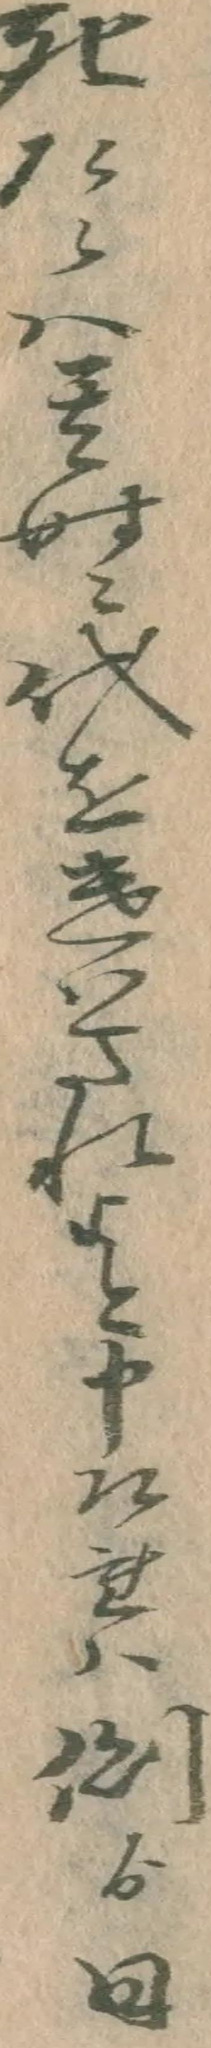死たらは其時に代を遣はされよと申け連は例ゟ日
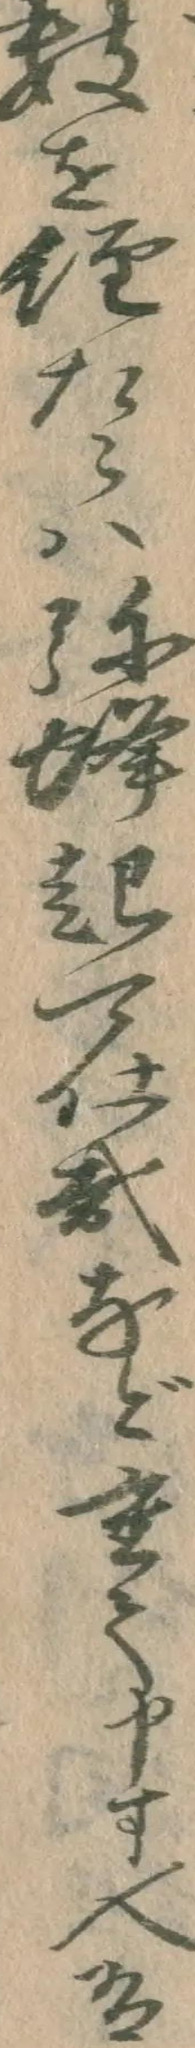数を経たらは弥蜂起可仕哉など重て申す人有
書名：切支丹御退治記 49巻. [2]
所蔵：国立国会図書館 National Diet Library, JAPAN
